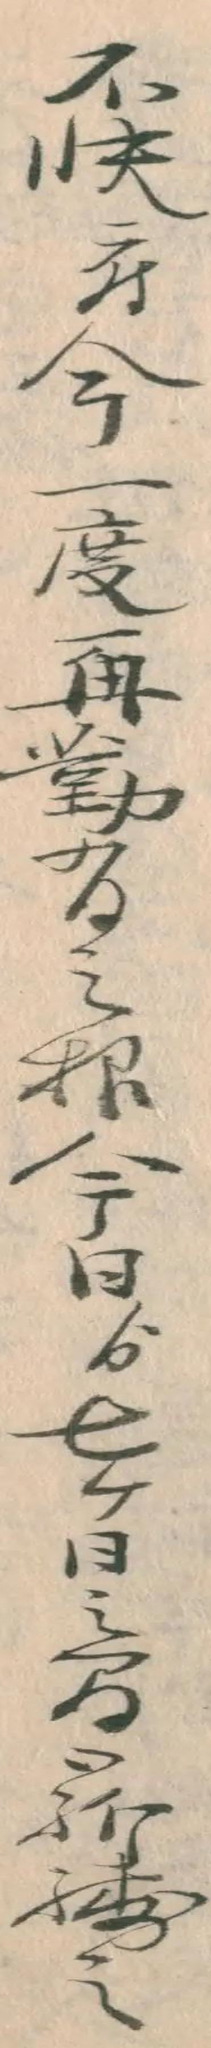不快ニ付今一度再勤有之様今日ゟ七ケ日之間御祈祷之
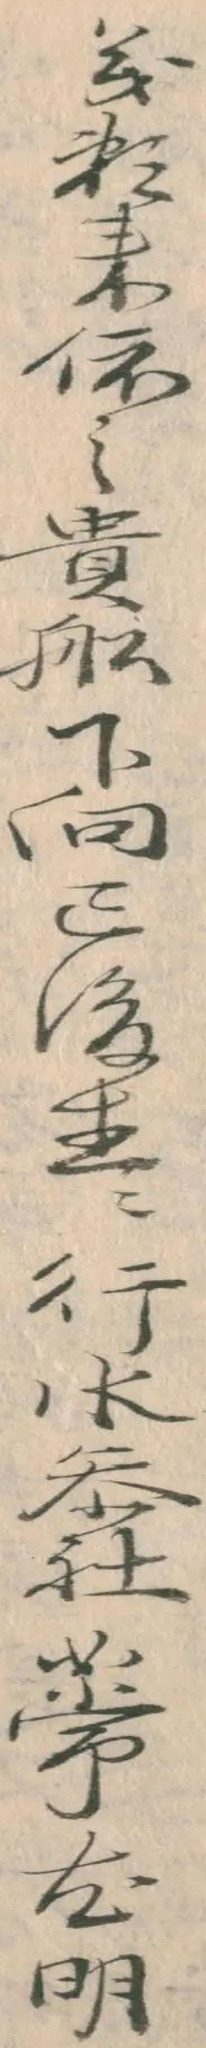義頼来依之貴舩下向已後直ニ行水参社如常尤明
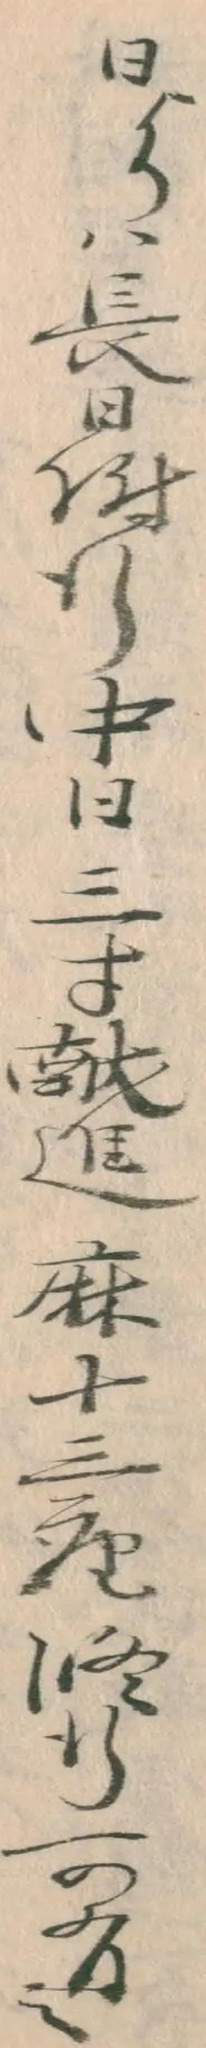日よりは長日附行中日三寸献進麻十三座修行可有之
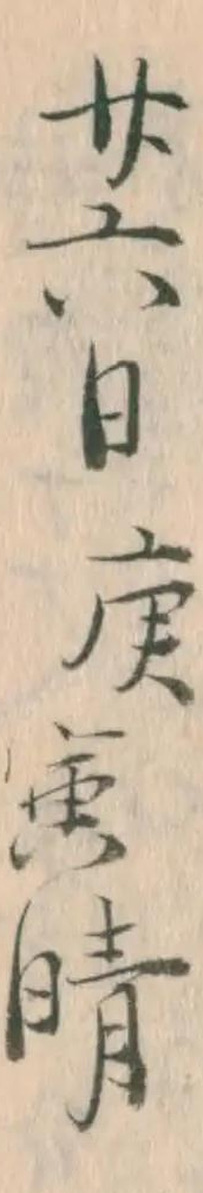廿六日庚寅晴
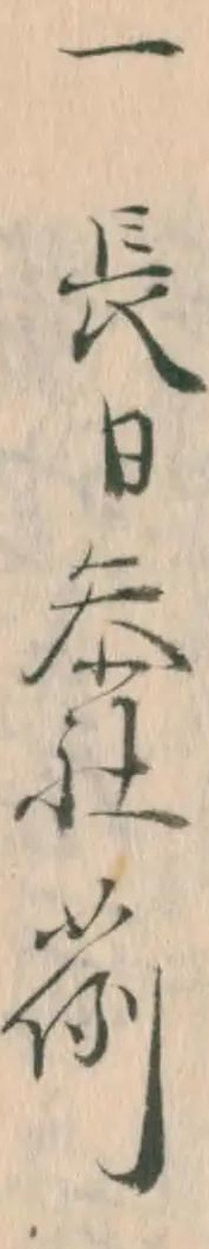一長日参社如例
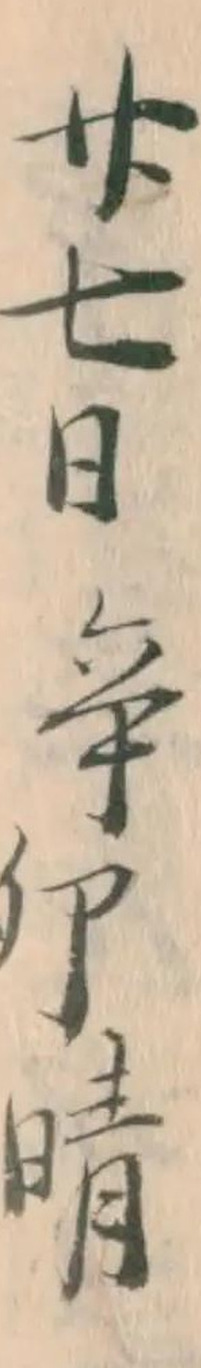廿七日辛卯晴
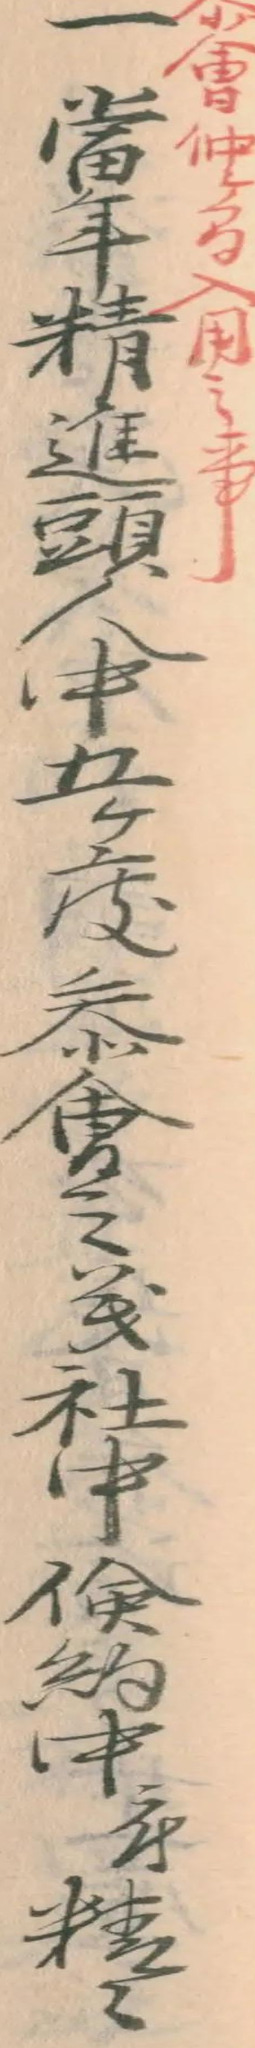一當年精進頭人中五ケ度参會之義社中倹約中ニ付精々
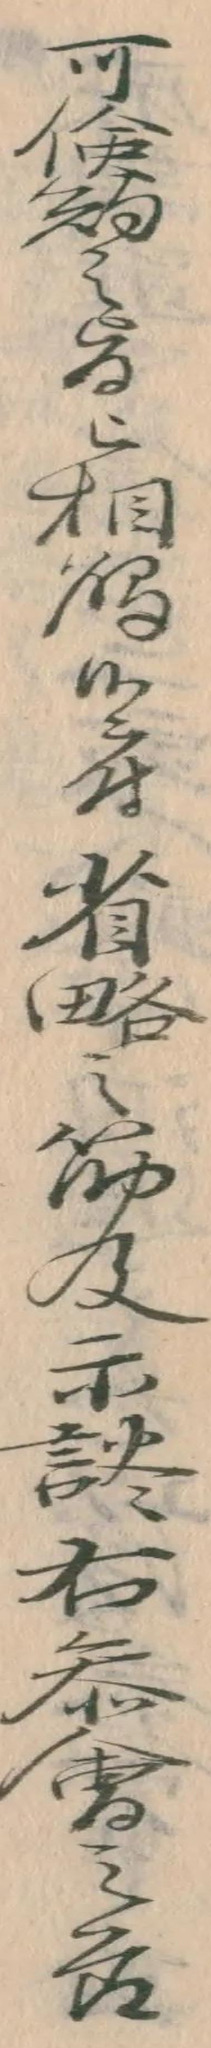可倹約之旨被相觸候ニ付省略之筋及示談右参會之節
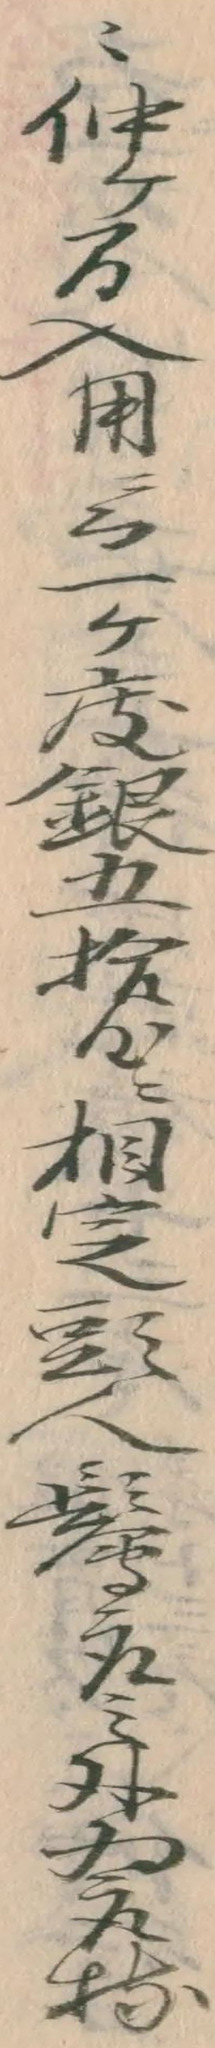々仲ケ間入用ニ而一ケ度銀五拾匁ニ相定頭人髪取之外為取持
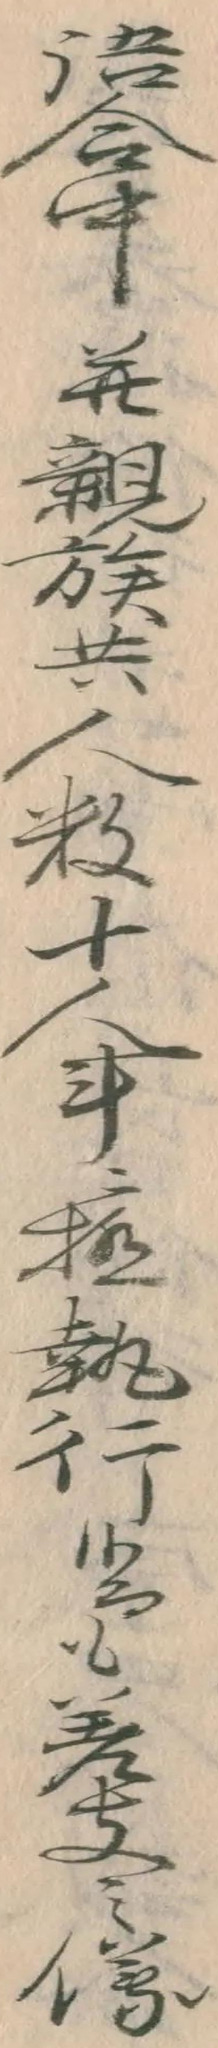語合中并親族共人数十人斗に極執行候而も差支之儀
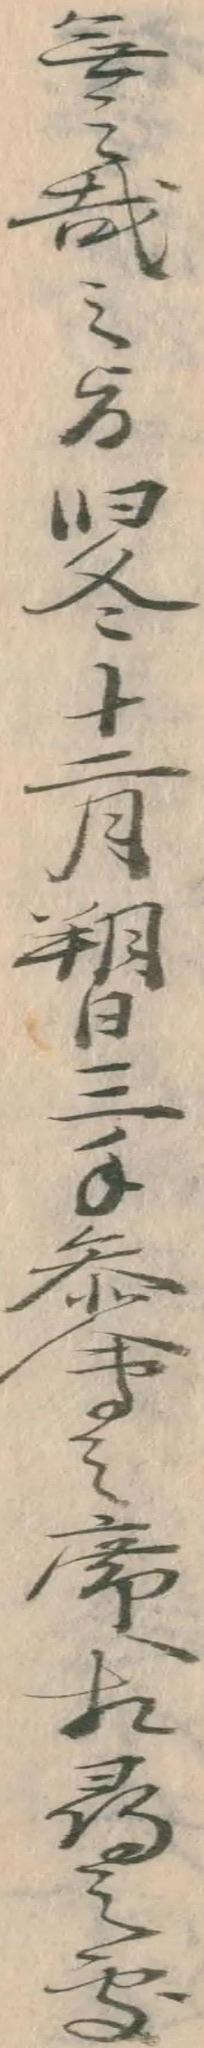無之哉之旨旧冬十二月朔日三手参會之席へ相尋之處
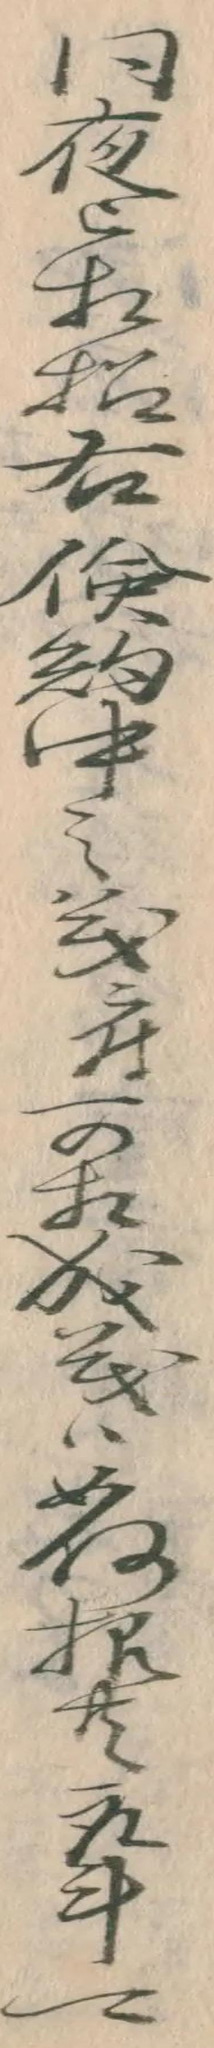同夜被相招右倹約中之義ニ付可相成義ハ如何様共取斗可
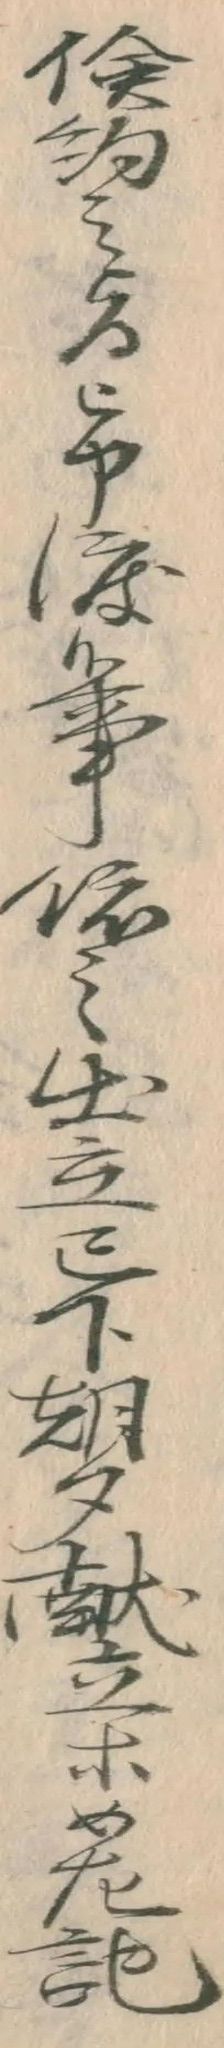倹約之旨被申渡候事依之出立已下朝夕献立等御左記
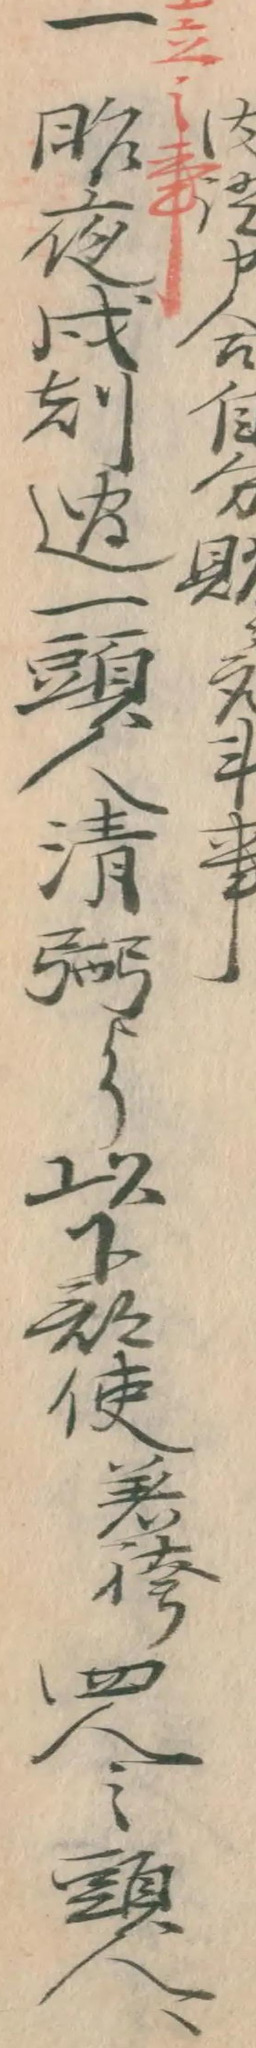一昨夜戌刻過一頭人清弼より以下部使着袴四人之頭人へ

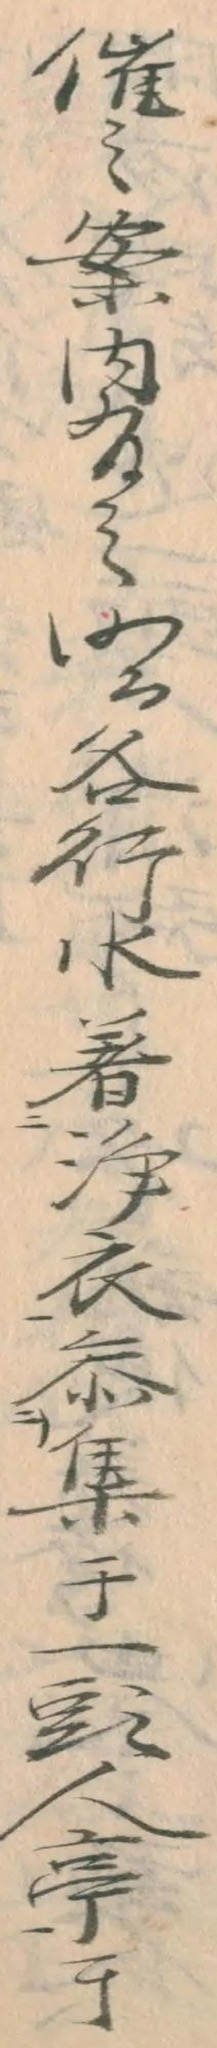催之案内有之仍而各行水着浄衣参集于一頭人亭于
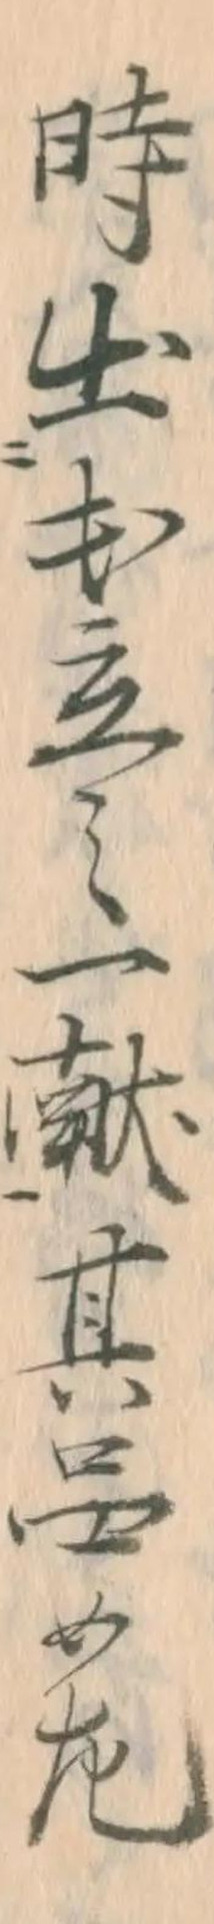時出本立之一献其品如左
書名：賀茂社記録. 第72冊
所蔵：国立国会図書館 National Diet Library, JAPAN
